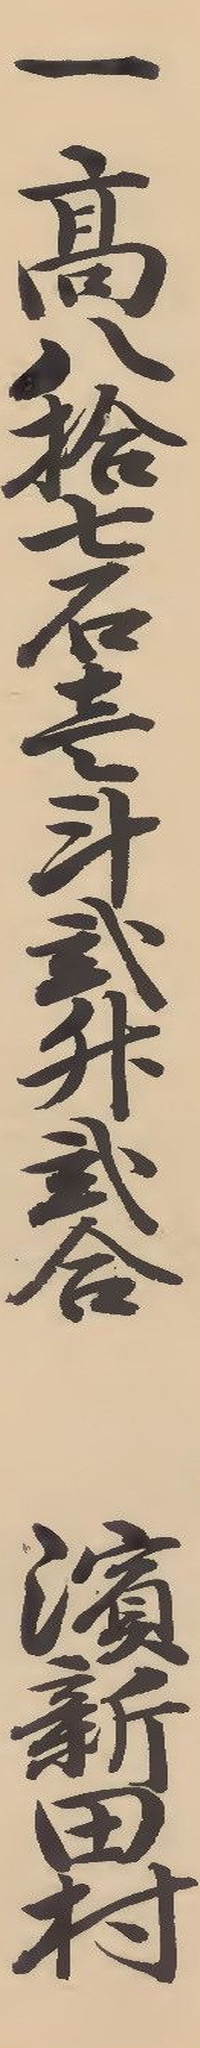一高八拾七石壱斗弐升弐合浜新田村
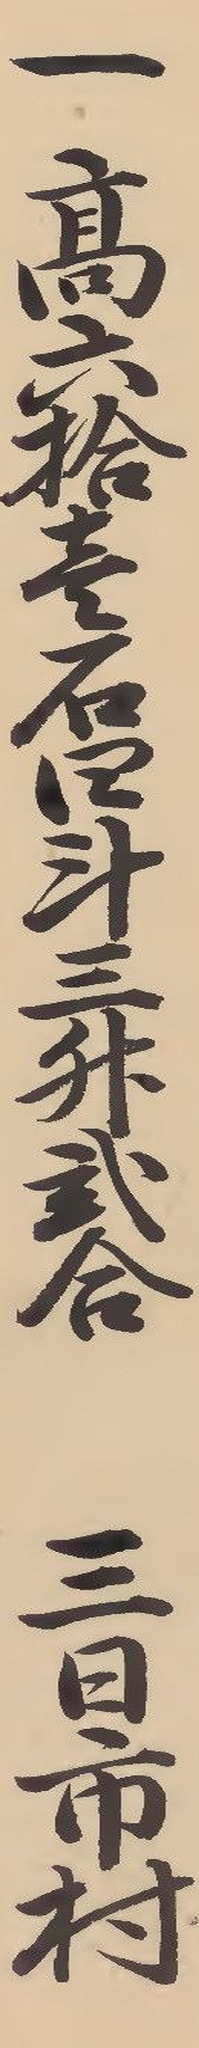一高六拾壱石四斗三升弐合三日市村
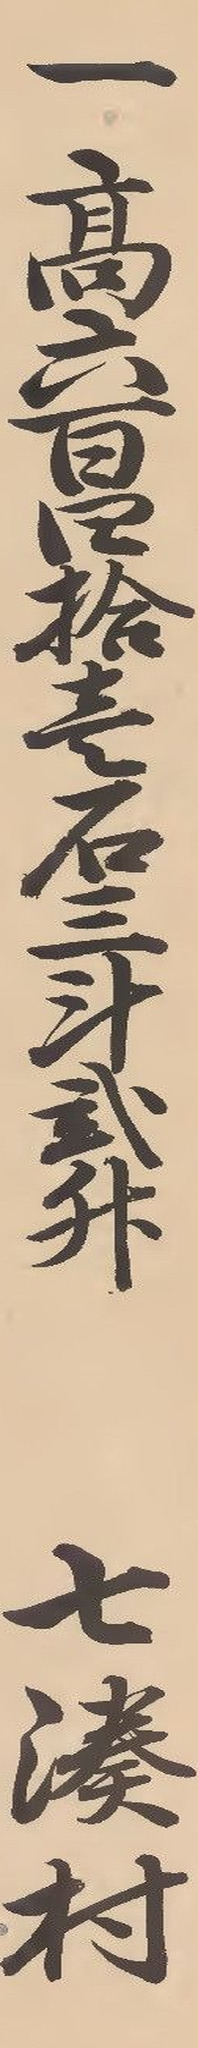一高六百四拾壱石三斗弐升七湊村
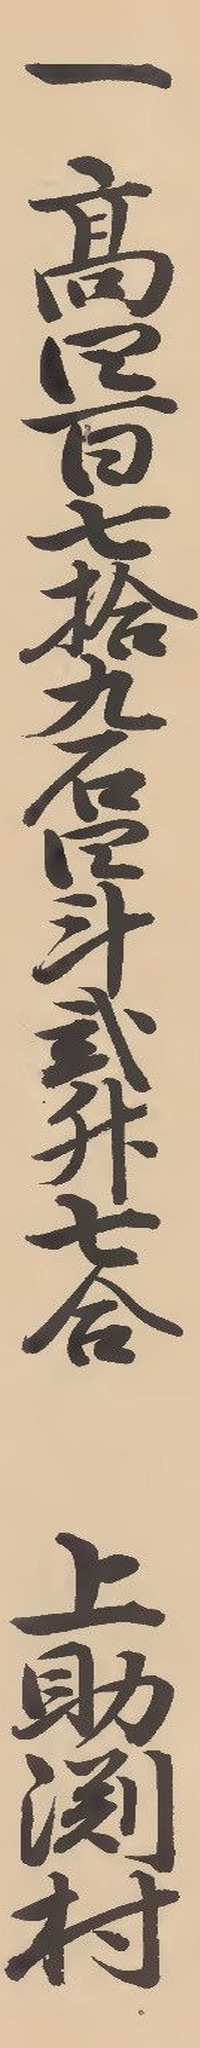一高四百七拾九石四斗弐升七合上助淵村
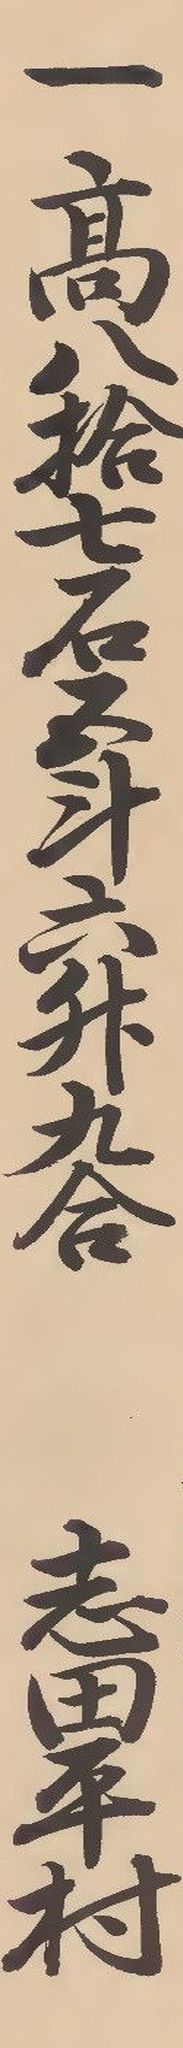一高八拾七石五斗六升九合志田平村
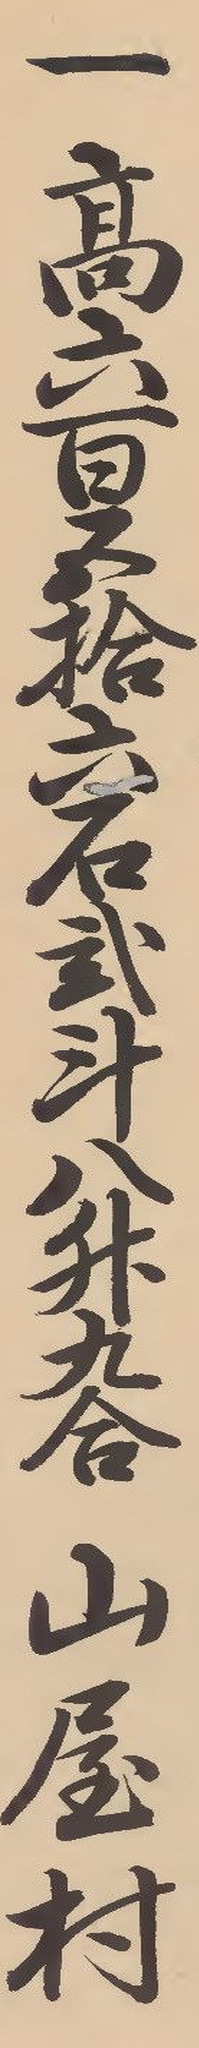一高六百五拾六石弐斗八升九合山屋村

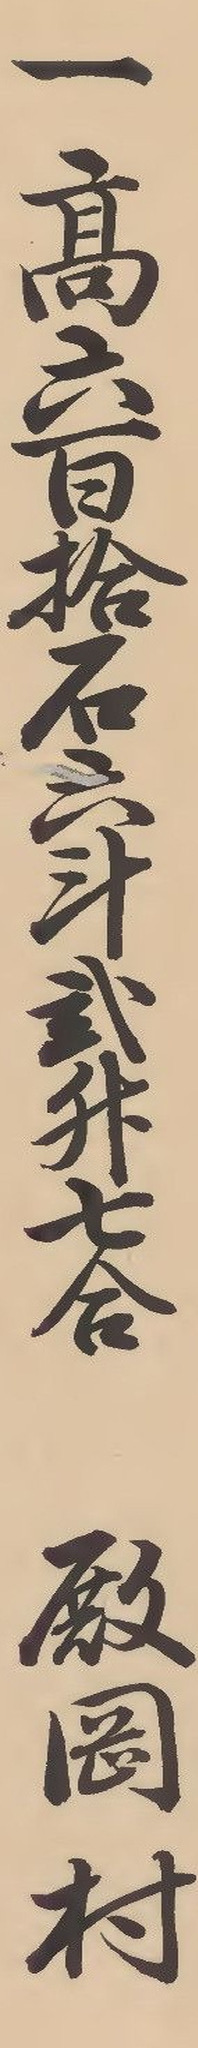一高六百拾石六斗弐升七合殿岡村
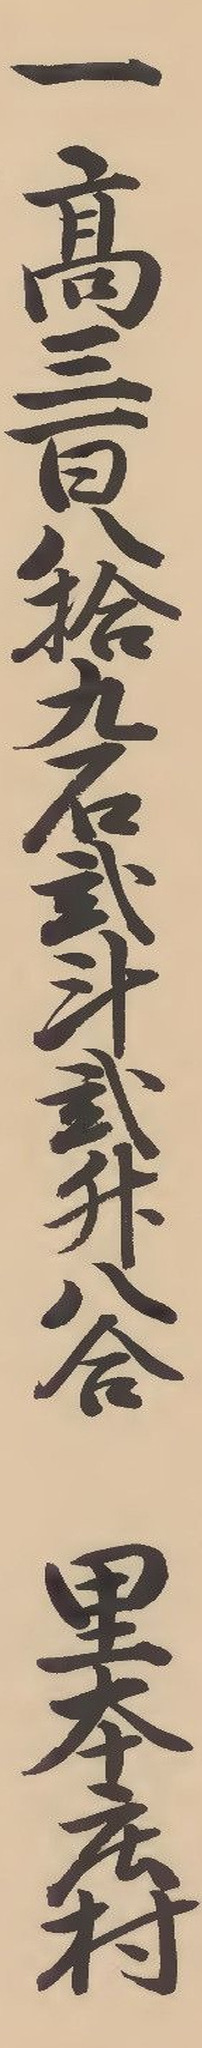一高三百八拾九石弐斗弐升八合里本荘村
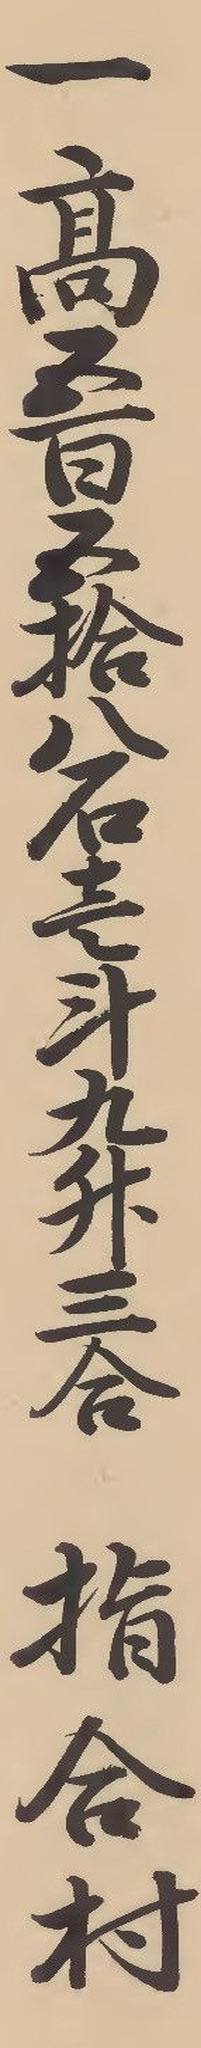一高五百五拾八石壱斗九升三合指合村
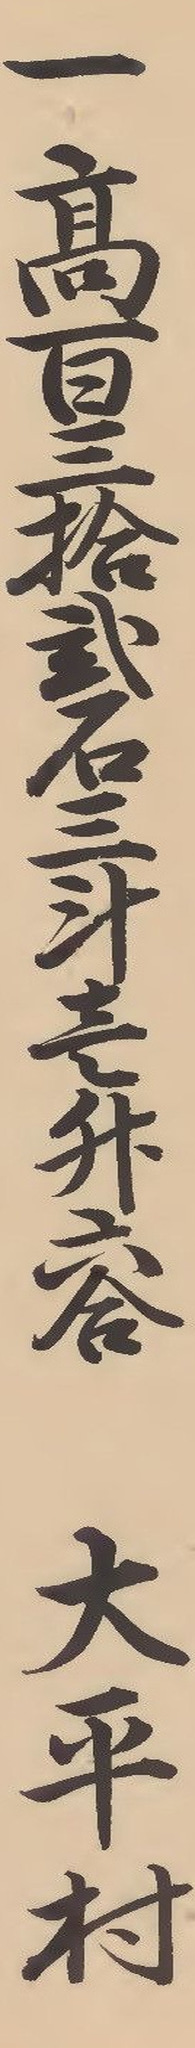一高百三拾弐石三斗壱升六合大平村
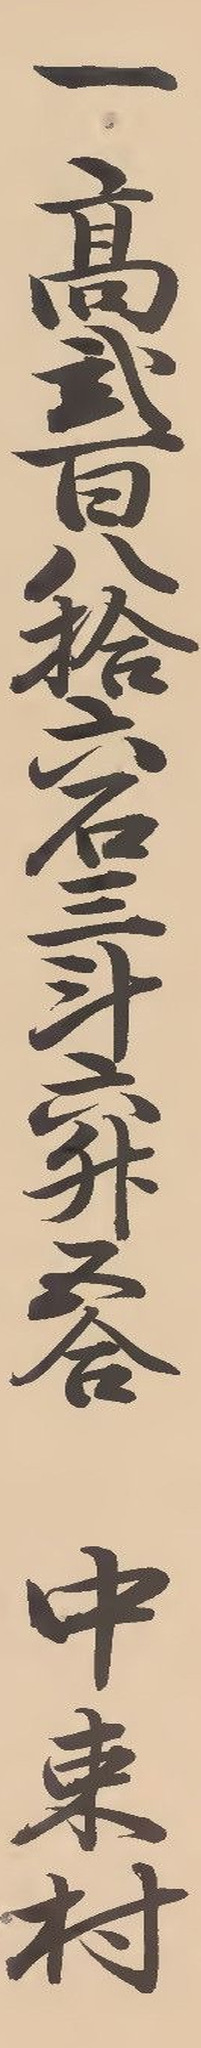一高弐百八拾六石三斗六升五合中束村
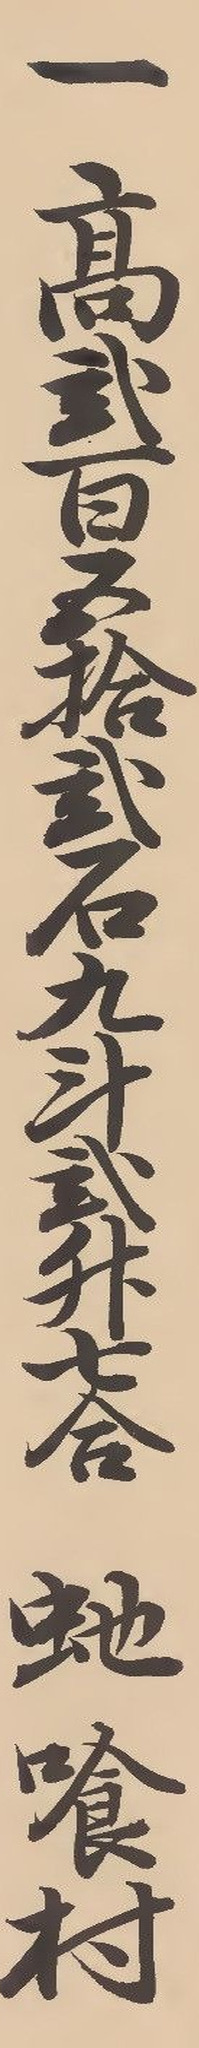一高弐百五拾弐石九斗弐升七合蛇喰村
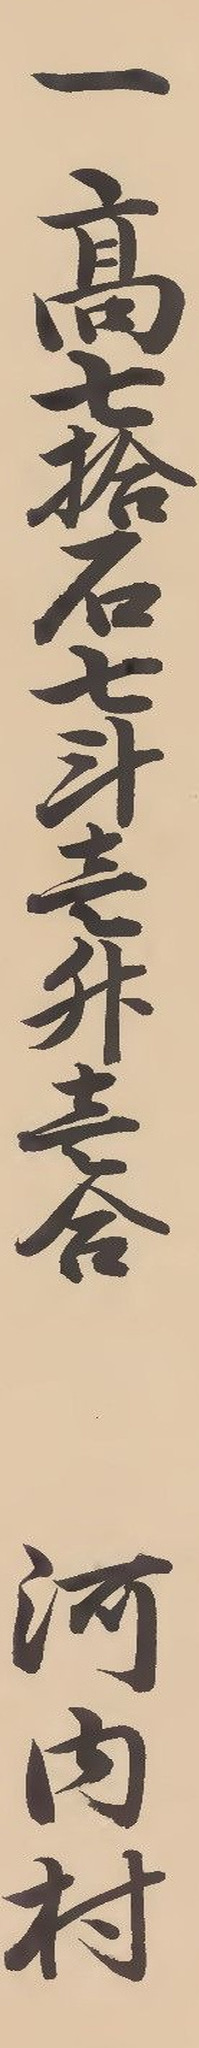一高七拾石七斗壱升壱合河内村
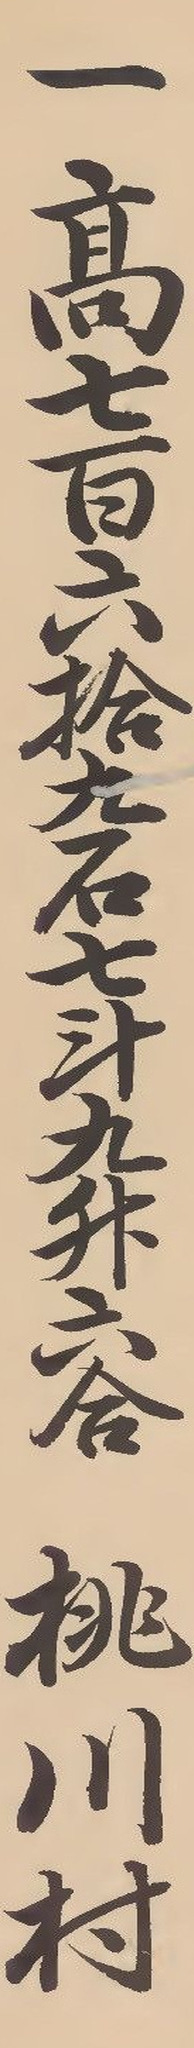一高七百六拾九石七斗九升六合桃川村

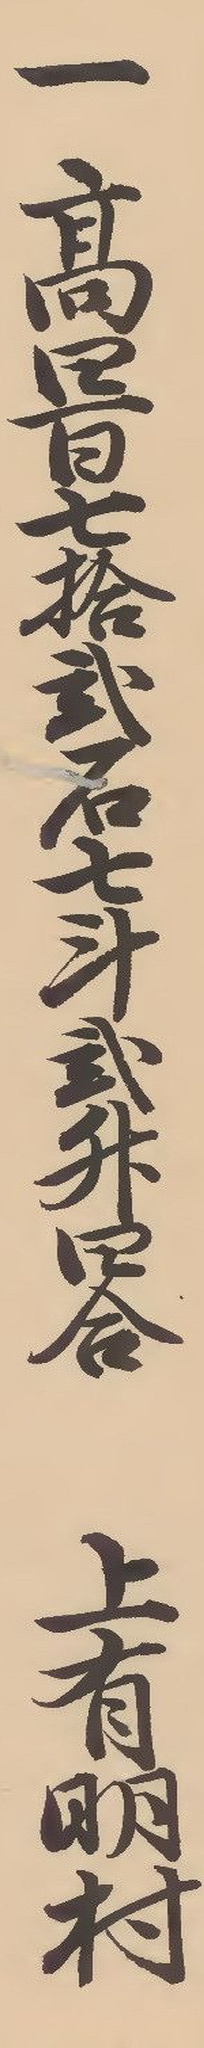一高四百七拾弐石七斗弐升四合上有明村
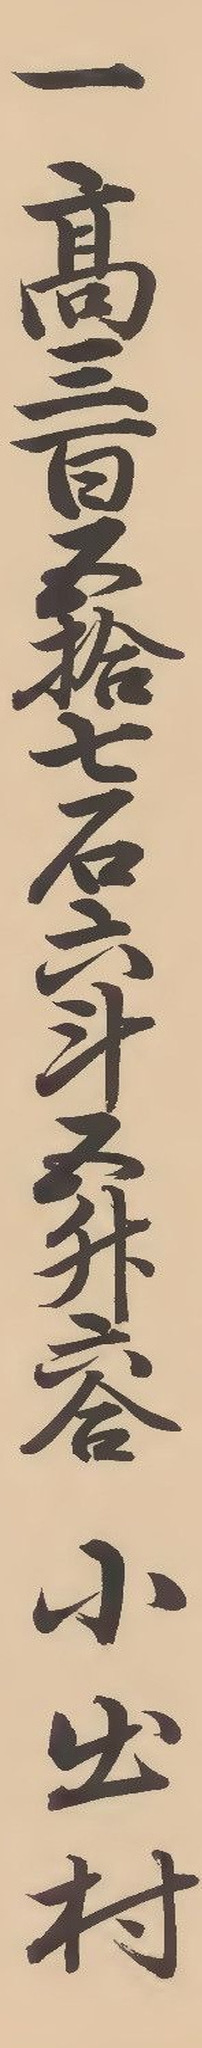一高三百五拾七石六斗五升六合小出村
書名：越後国郷帳　下
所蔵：国立公文書館 National Archives of Japan
